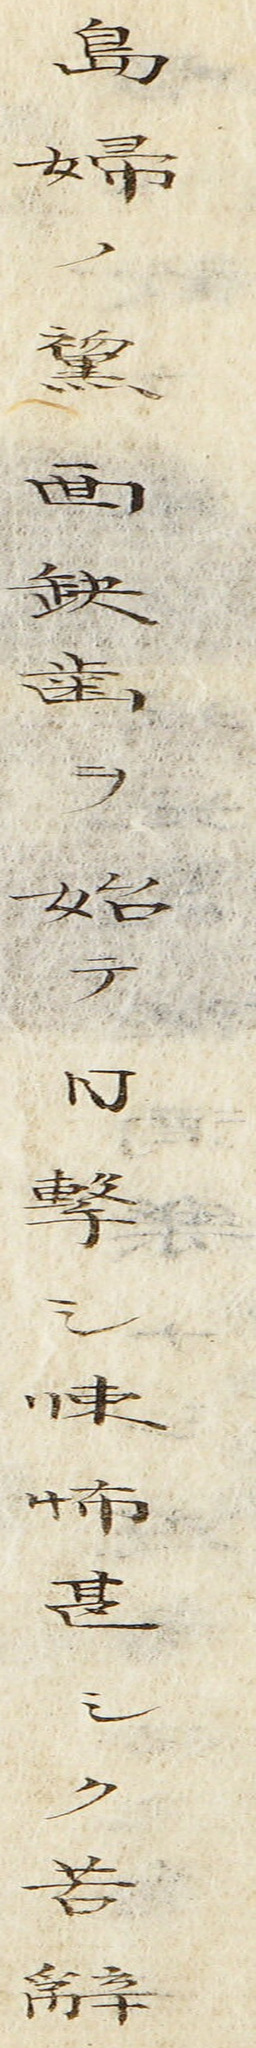島婦ノ黧面欠歯ヲ始テ目撃シ悚怖甚シク苦辞
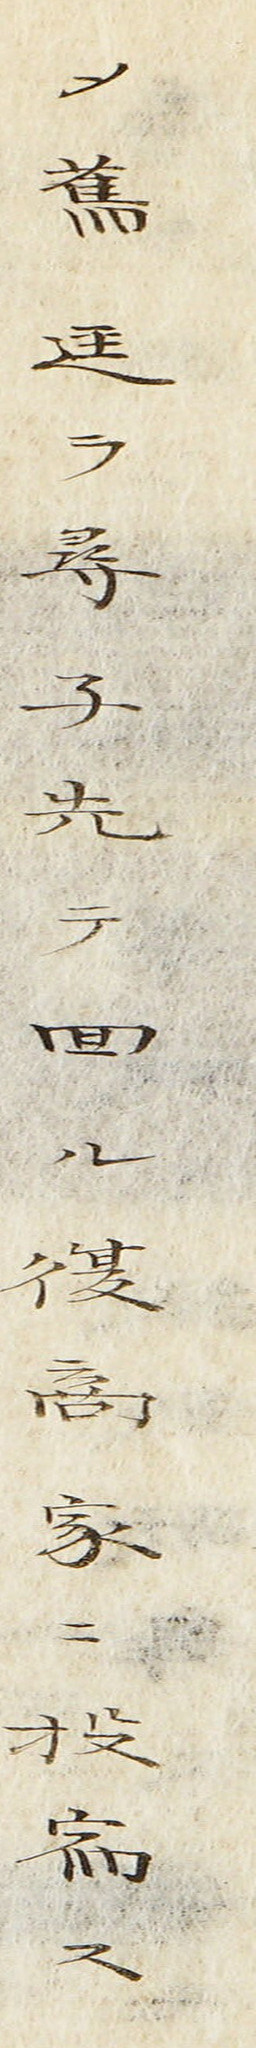シテ旧逕ヲ尋ネ先テ回ル復商家ニ投宿ス
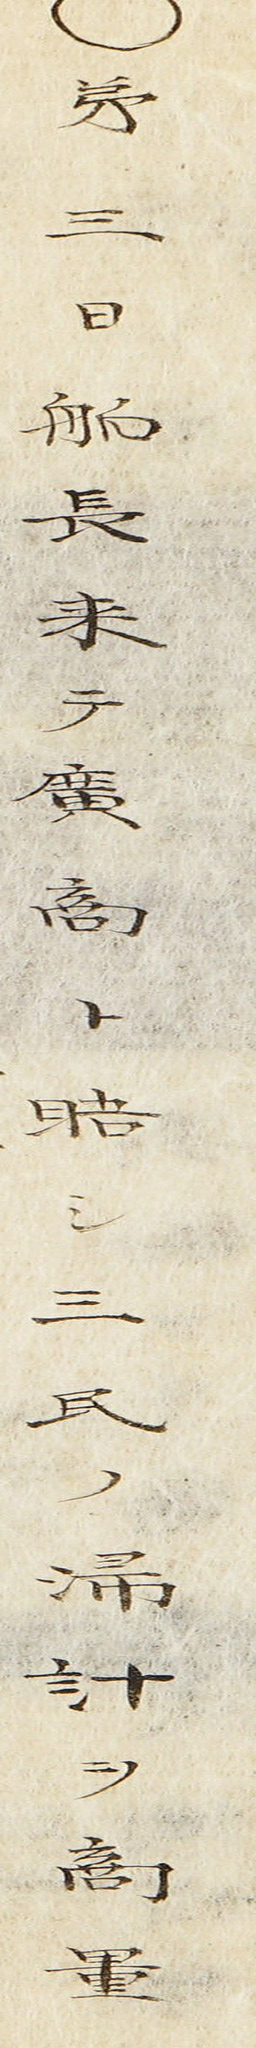○第三日舶長来テ広商ト晤シ三民ノ㴆計ヲ商量
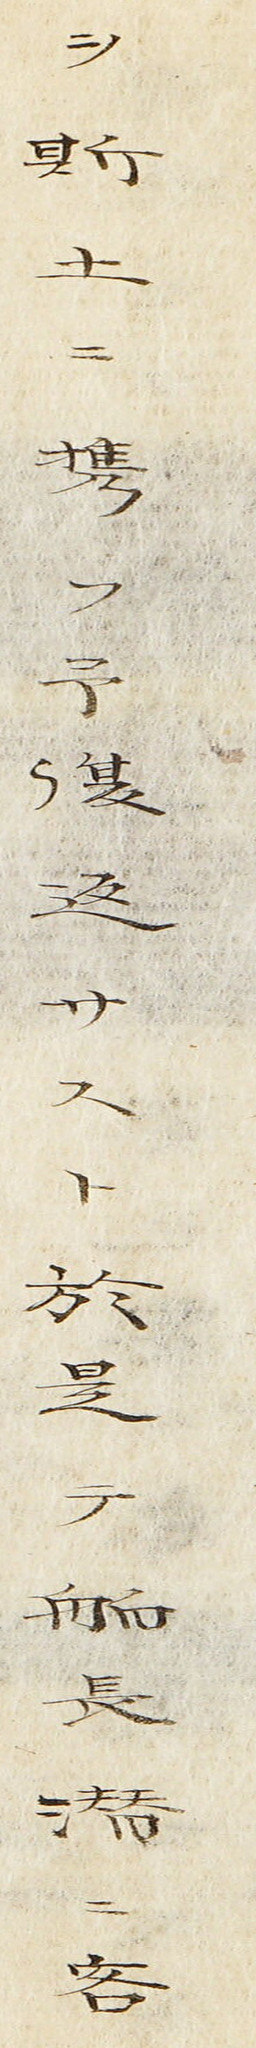ヲ斯土ニ携フ予復返サスト於是テ舶長潜ニ客
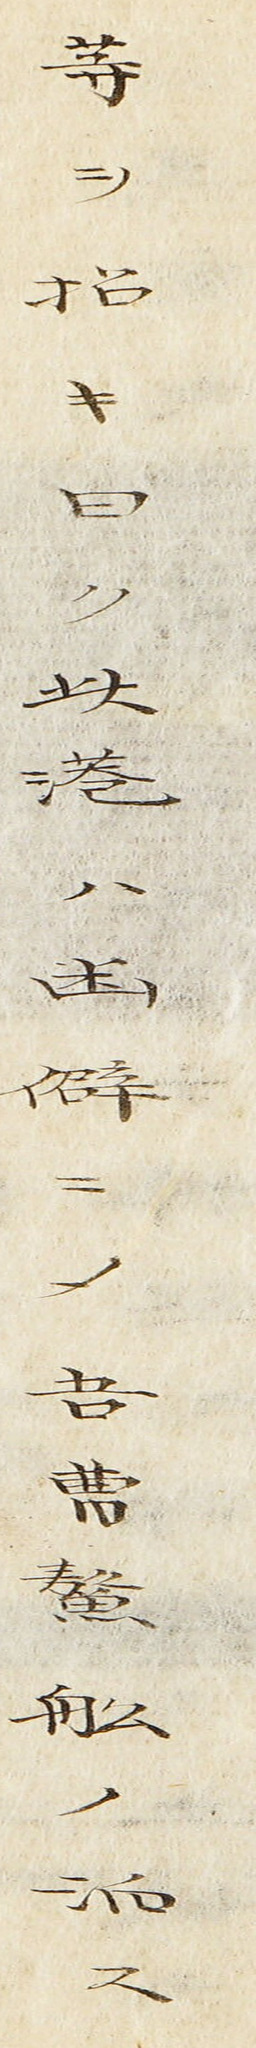等ヲ招キ曰ク此港ハ僻ニシテ吾曹鰲舩ノ泊ス
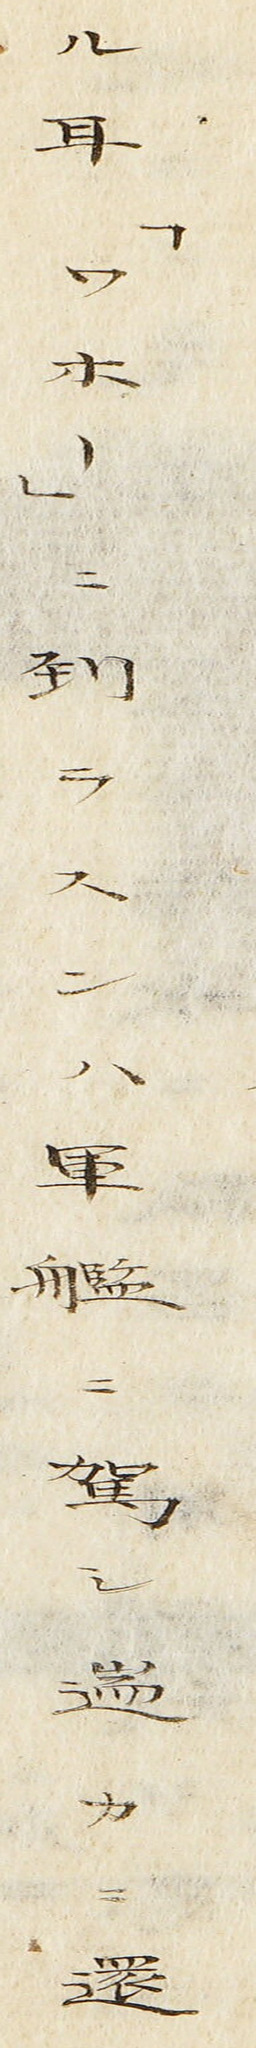ル耳「ワホー」ニ到ラスンハ軍艦ニ駕シ遄カニ還
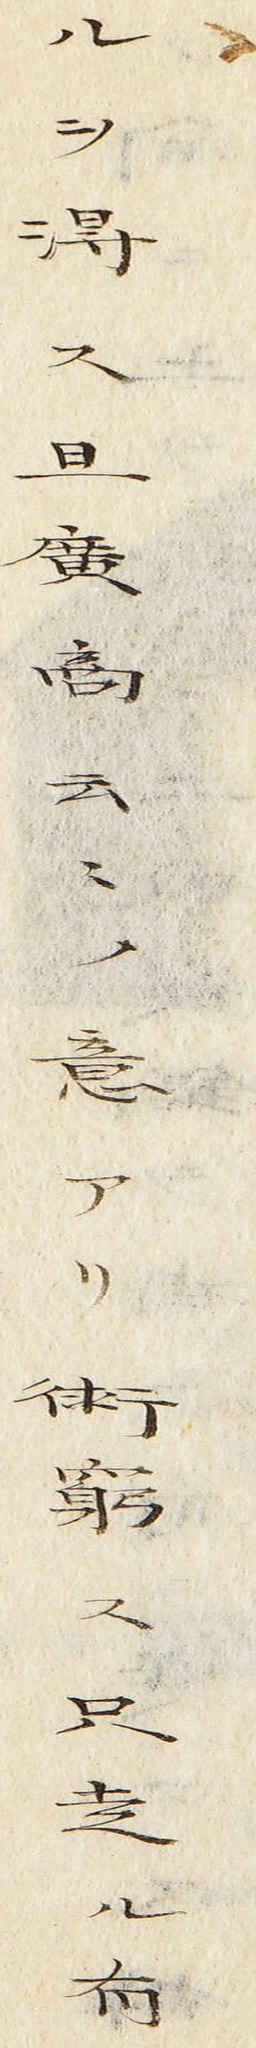ルヲ得ス旦広商云々ノ意アリ術窮ス只走ル有
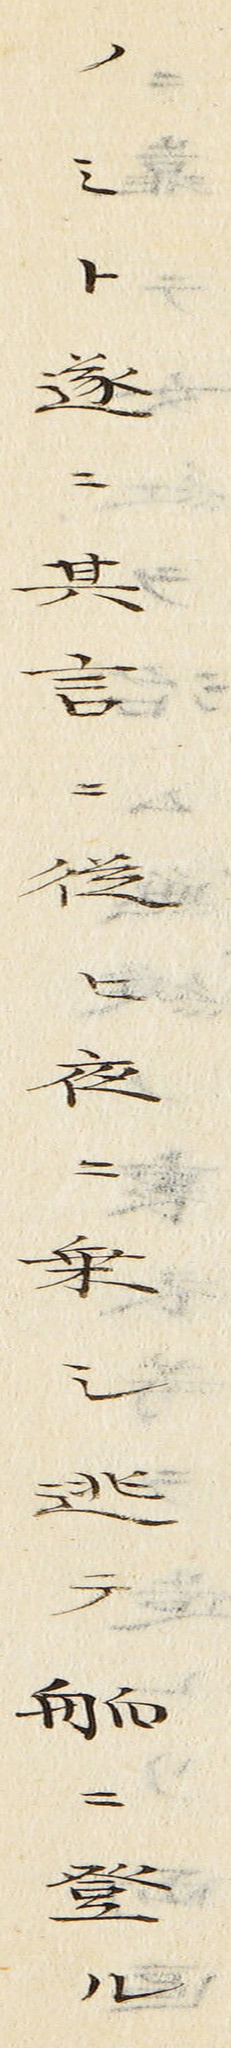ノミト遂ニ其言ニ従ヒ夜ニ乗シ逃テ舶ニ登ル
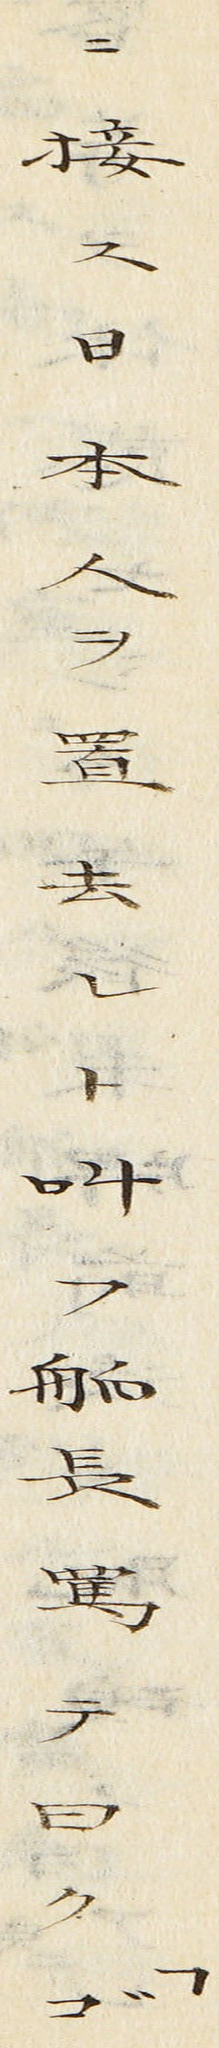ニ接ス日本人ヲ置去レト叫フ舶長罵テ曰ク「ゴ
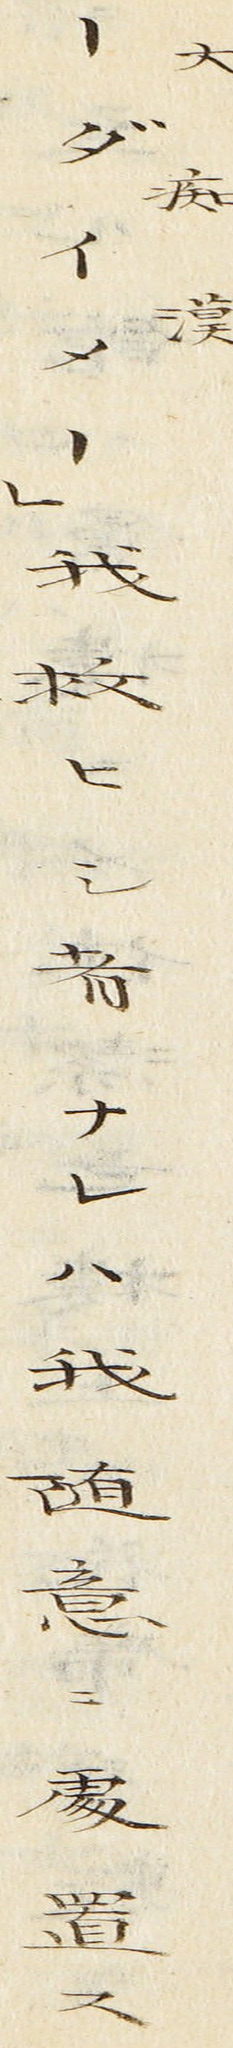ーダイメー」我救ヒシ者ナレハ我随意ニ処置ス
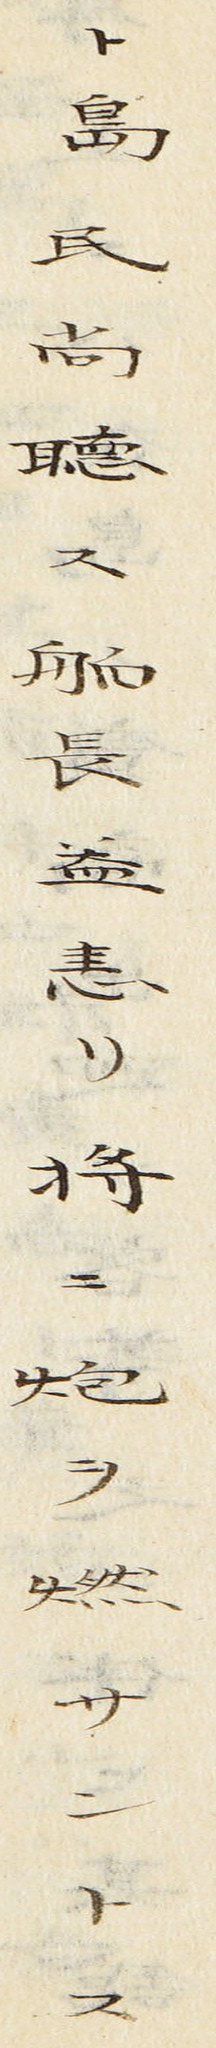ト島民尚聴ス舶長益恚リ将ニ炮ヲ燃サントス
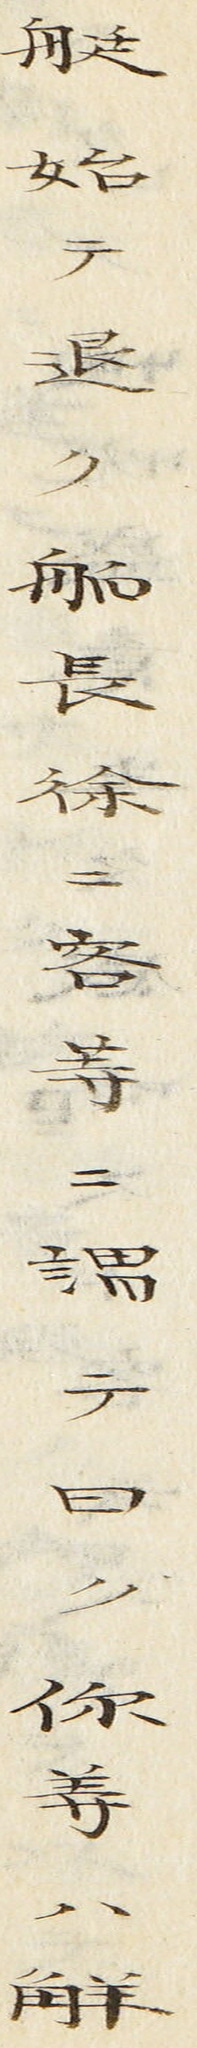艇始テ退ク舶長徐ニ客等ニ謂テ曰ク你等ハ解
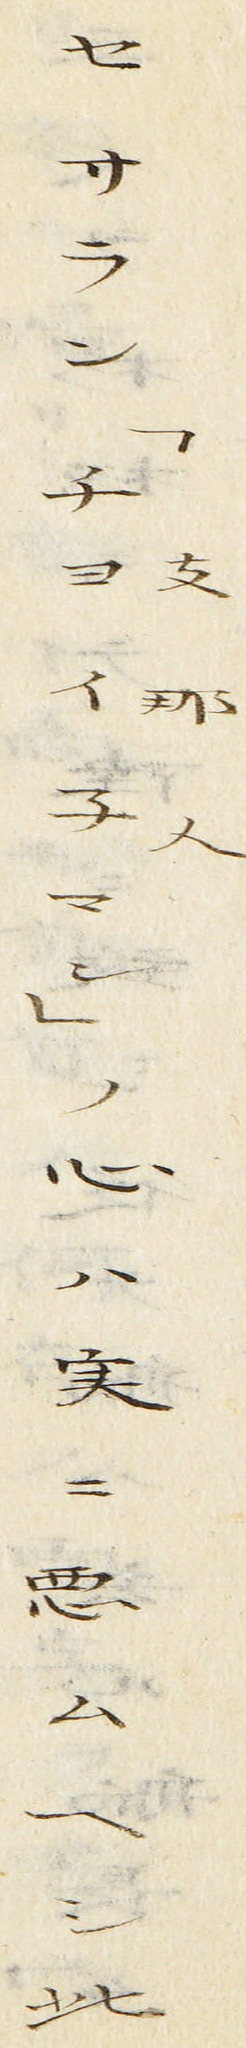セサラン「チヨイネマン」ノ心ハ実ニ悪ムヘシ此
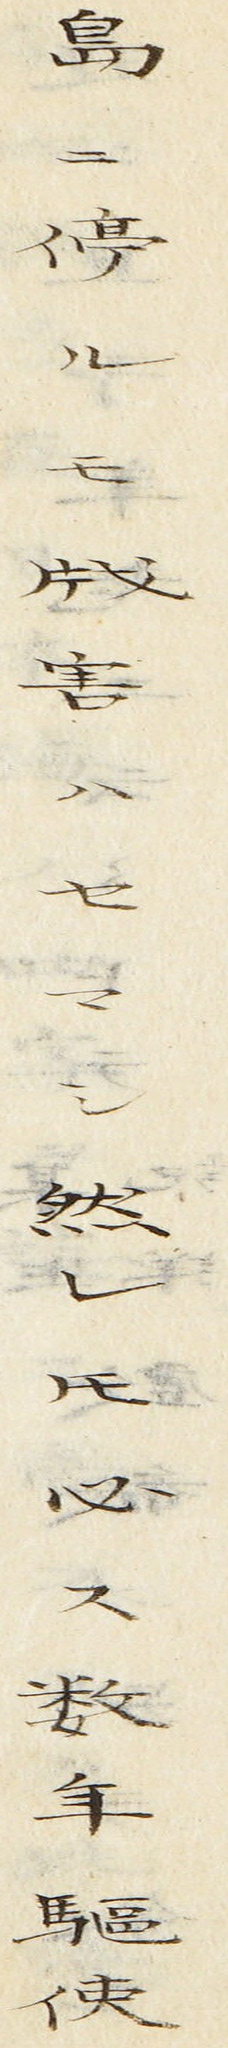島ニ停ルモ戕害ハセマシ然レトモ必ス数年駆使
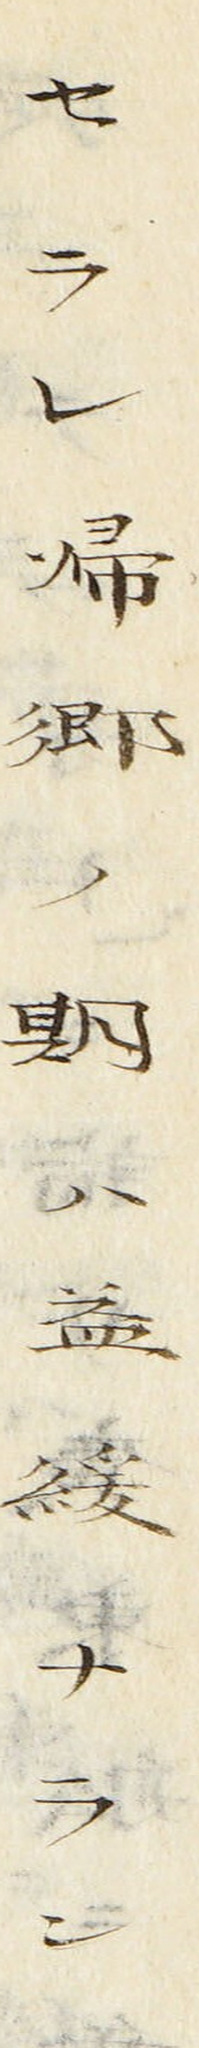セラレ帰郷ノ期ハ益緩ナラン
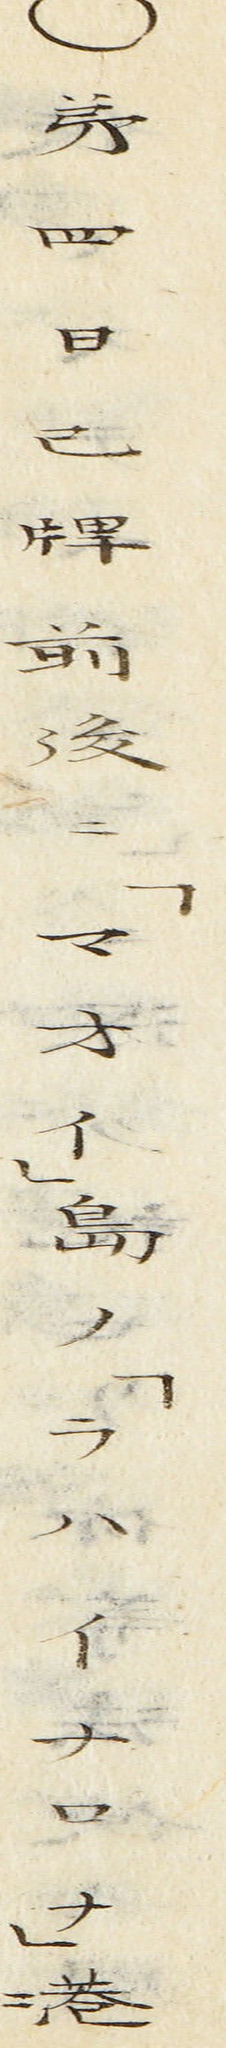○第四日巳牌前後ニ「マオイ」島ノ「ラハイナロナ」港
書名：蕃談
